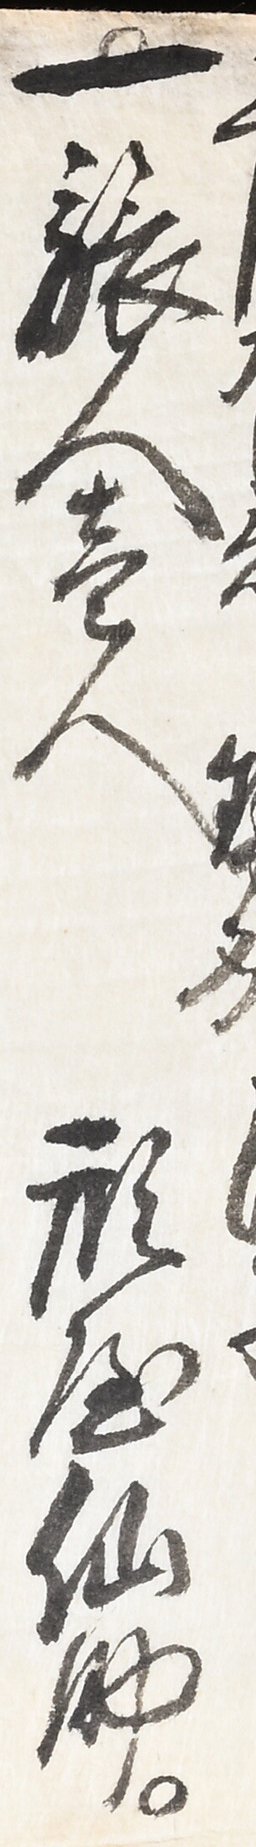一旅人壱人形屋仙助。
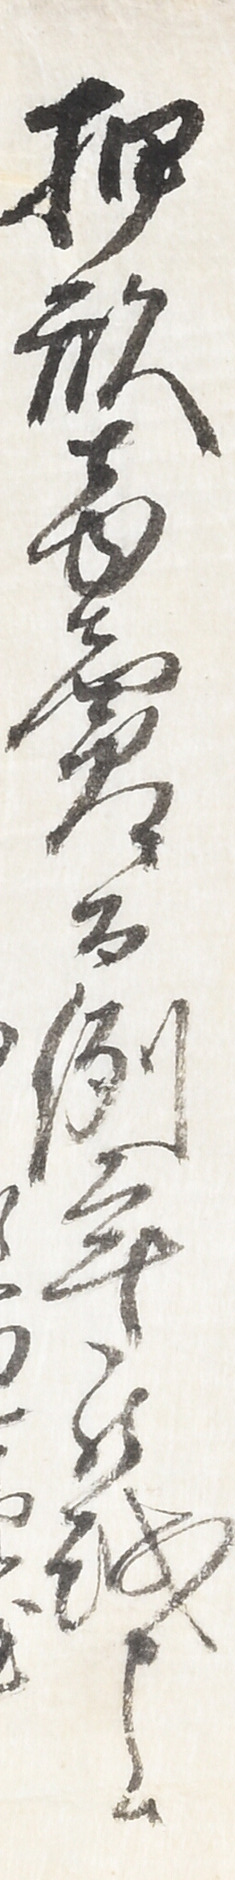押形商売ニ而例年罷越申候
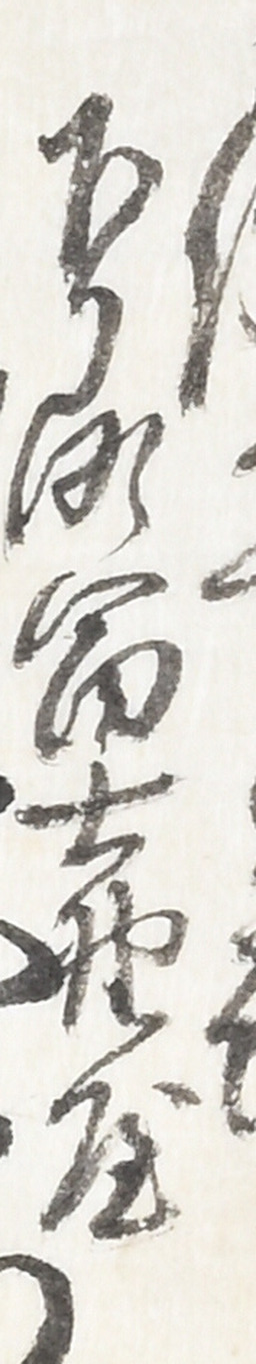下り町冨士野屋
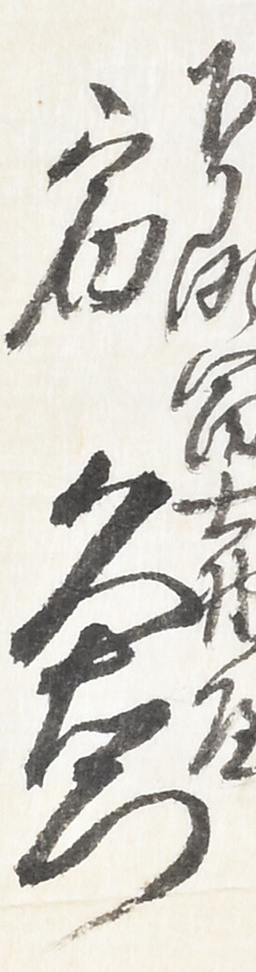宿久右衛門
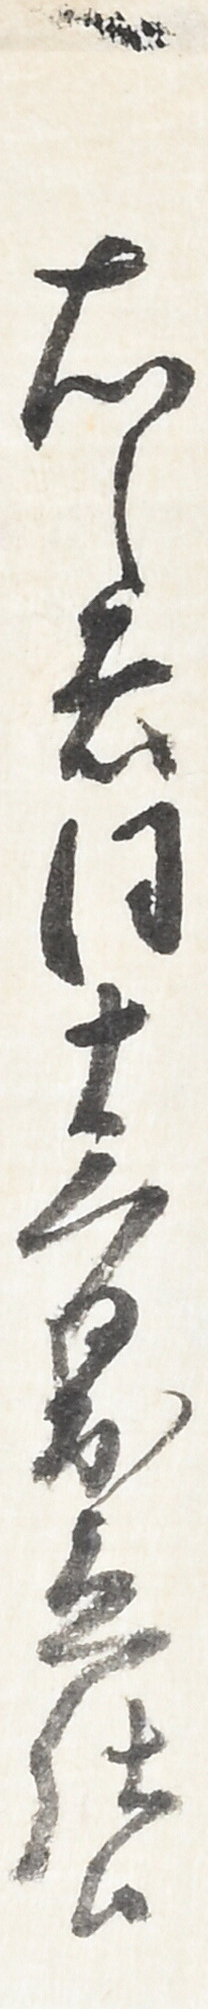右之者同十三日出立仕候
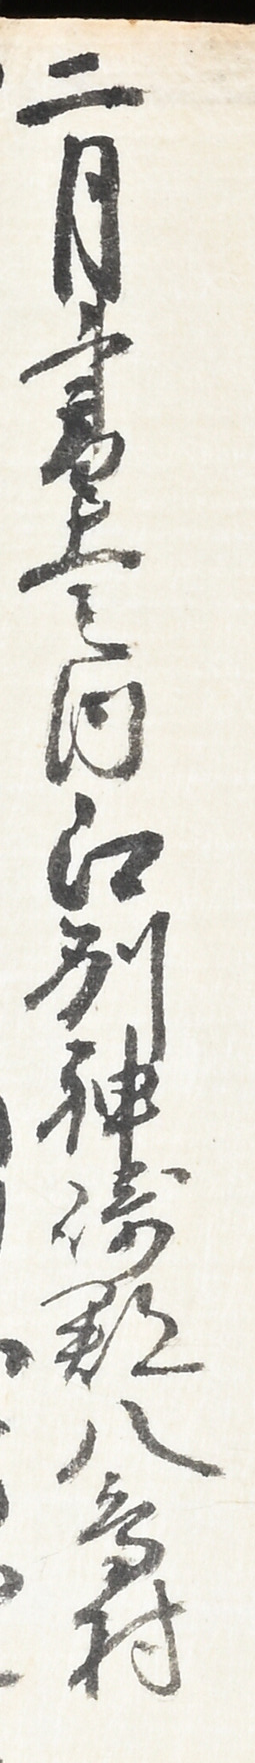二月書上之内江州神崎郡八鳥村
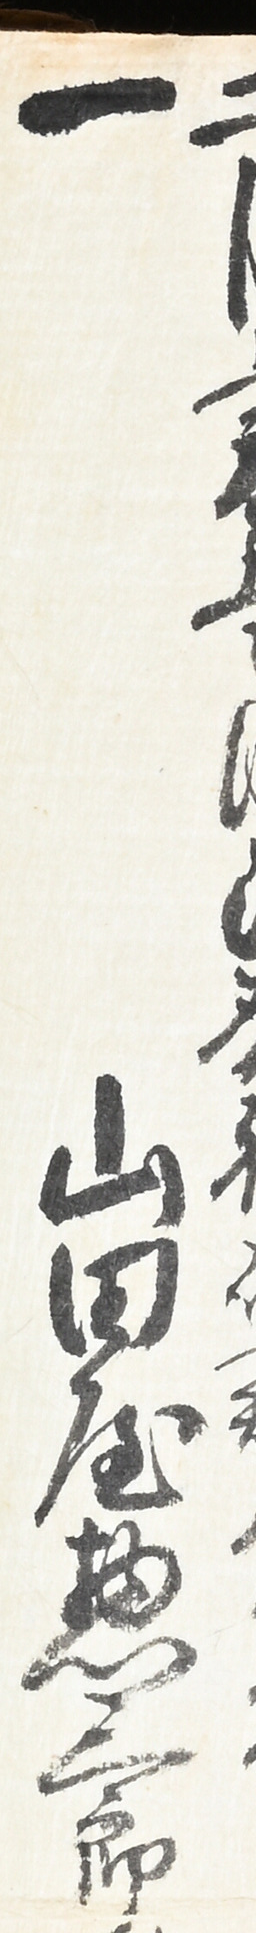一山田屋惣三郎、
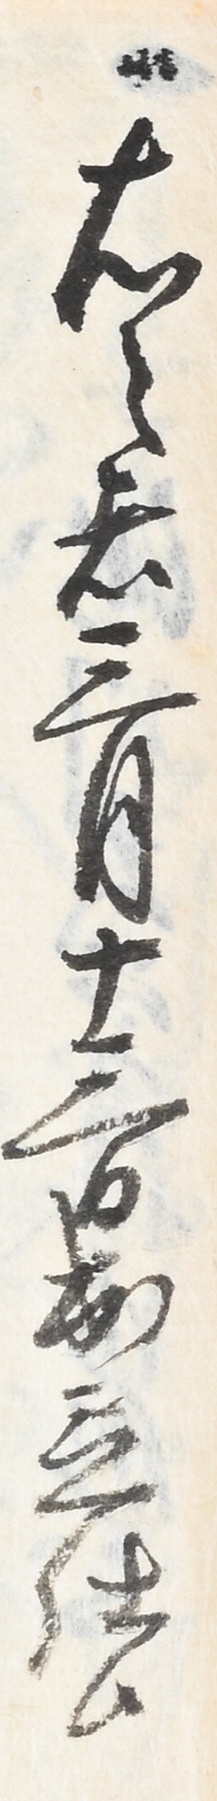右之者三月六日出立仕候

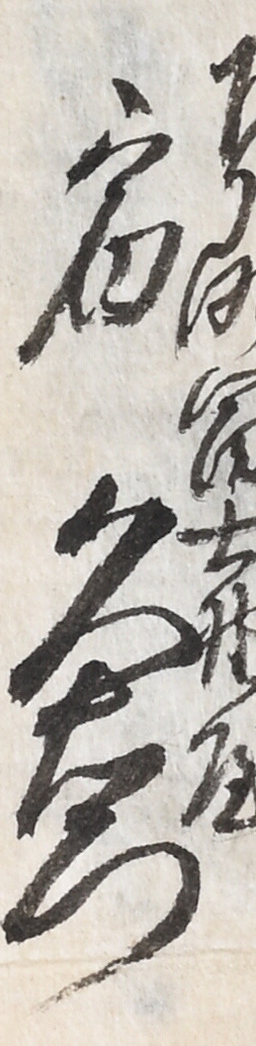宿平右衛門
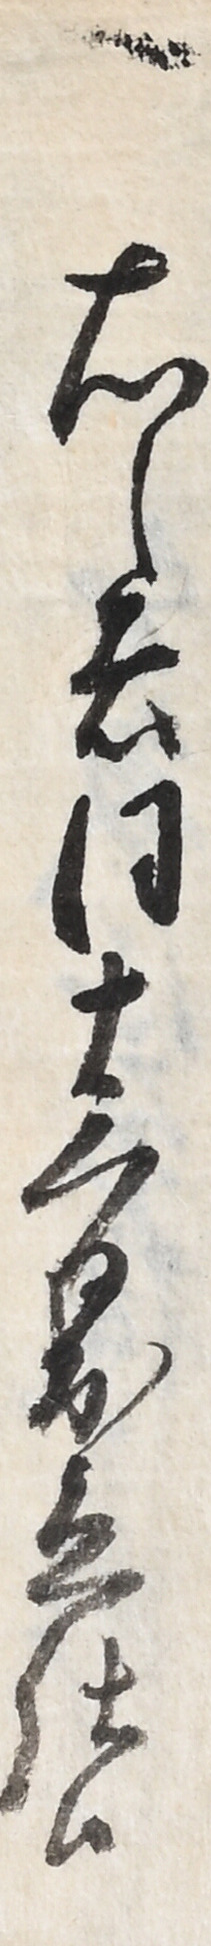右之者同十五日出立仕候
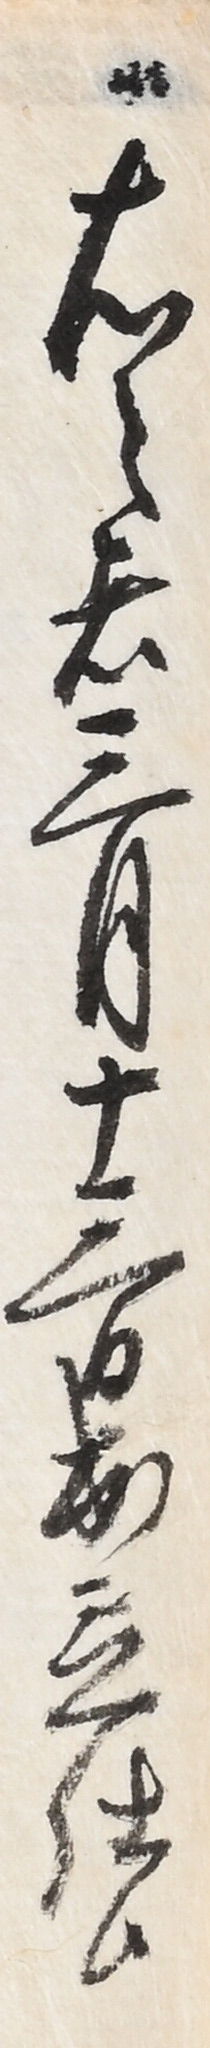右之者三月十三日出立仕候
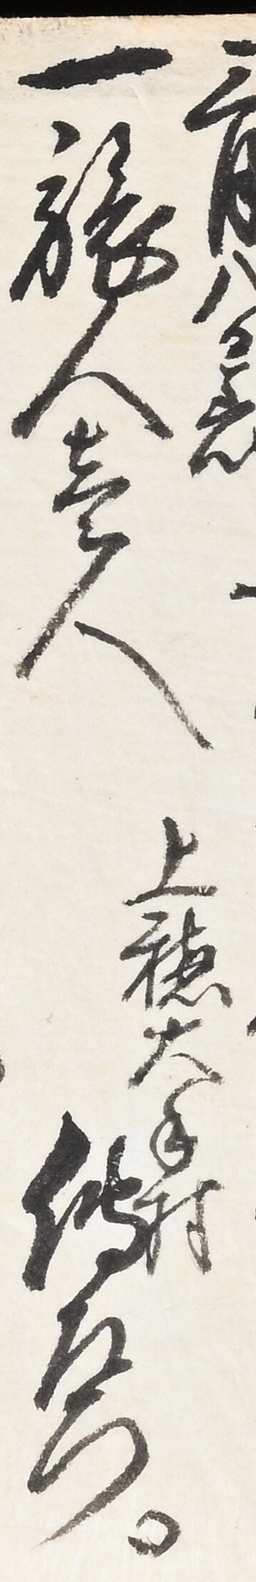一旅人壱人上穂大手村
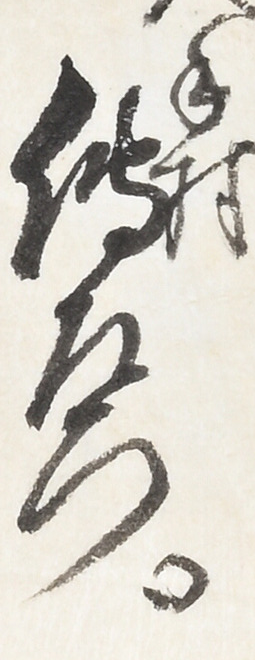伝左衛門。
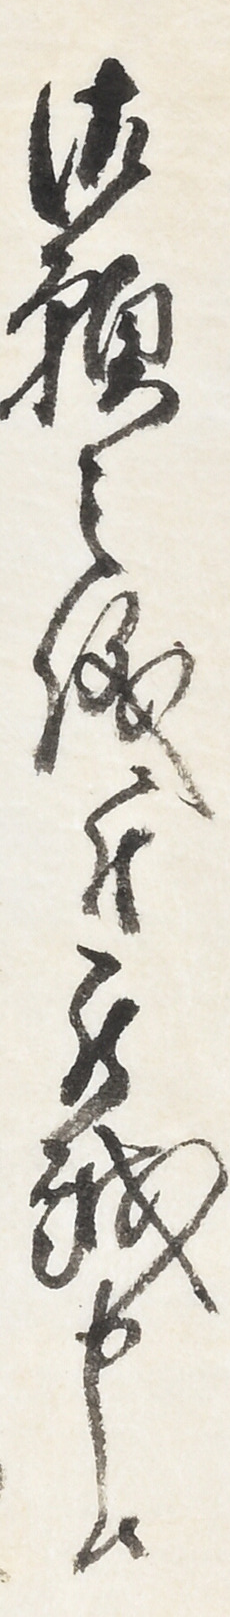御願之義ニ付罷越申候
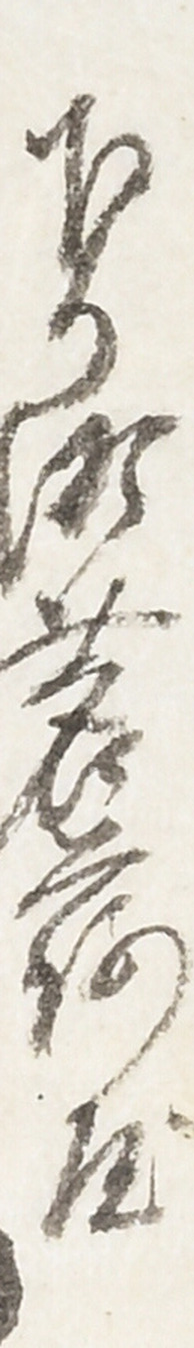下り町茗荷屋
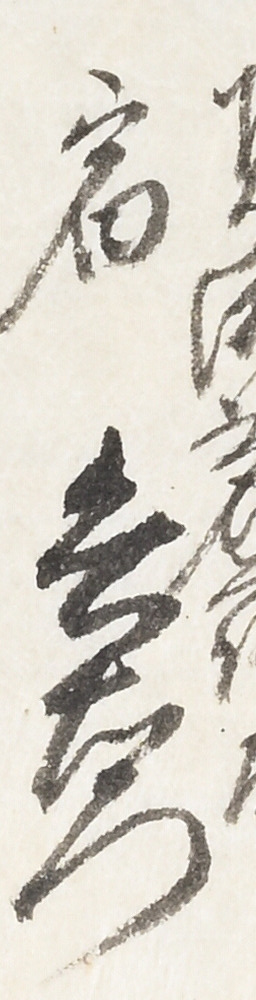宿平右衛門
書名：旅人泊控帳
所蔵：伊那市立高遠町図書館・合同会社AMANE
